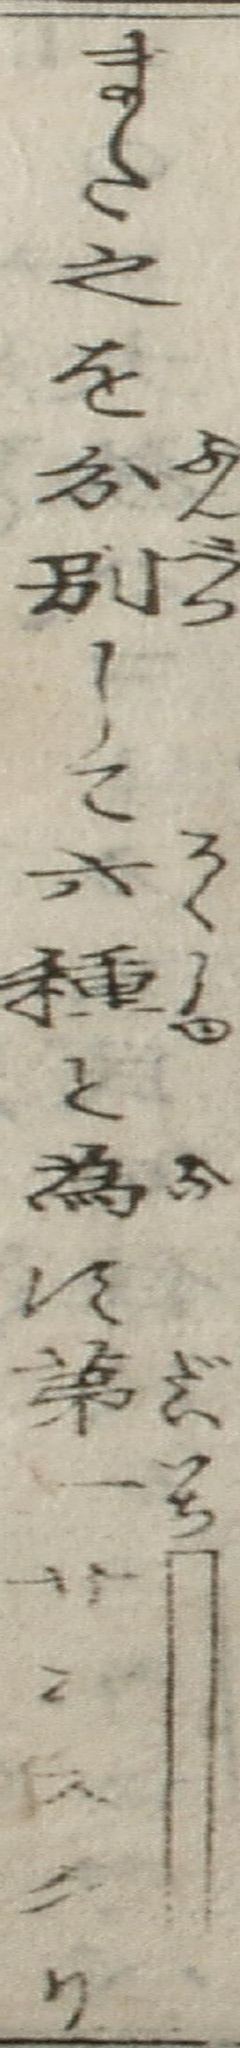また之を分別して六種と為す第一サンスクリ
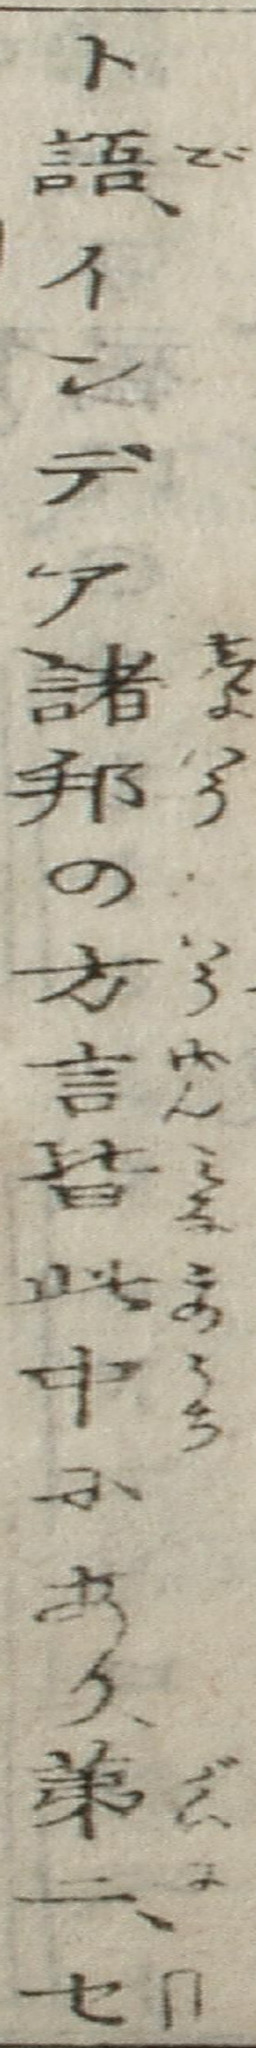ト語、インデア諸邦の方言皆此中にあり、第二、セ
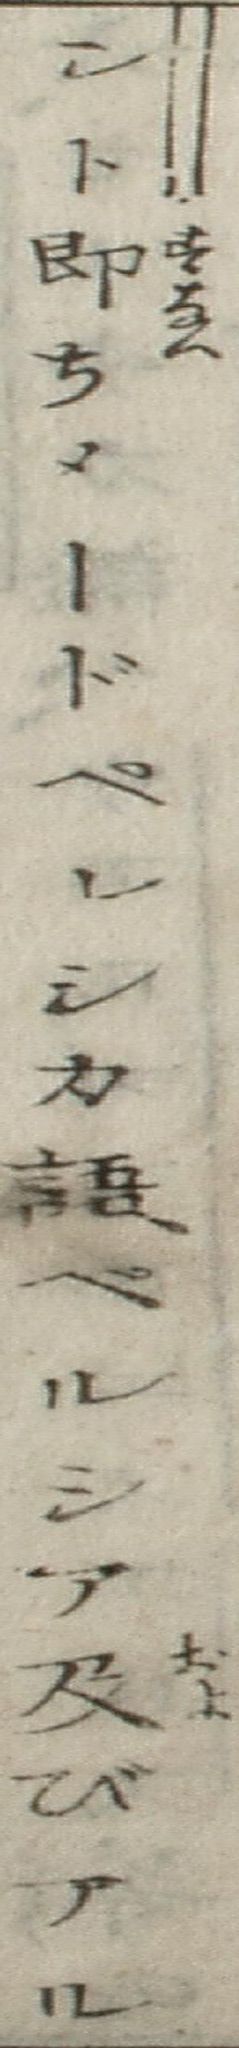ント即ちメードペレシカ語、ペルシア及びアル
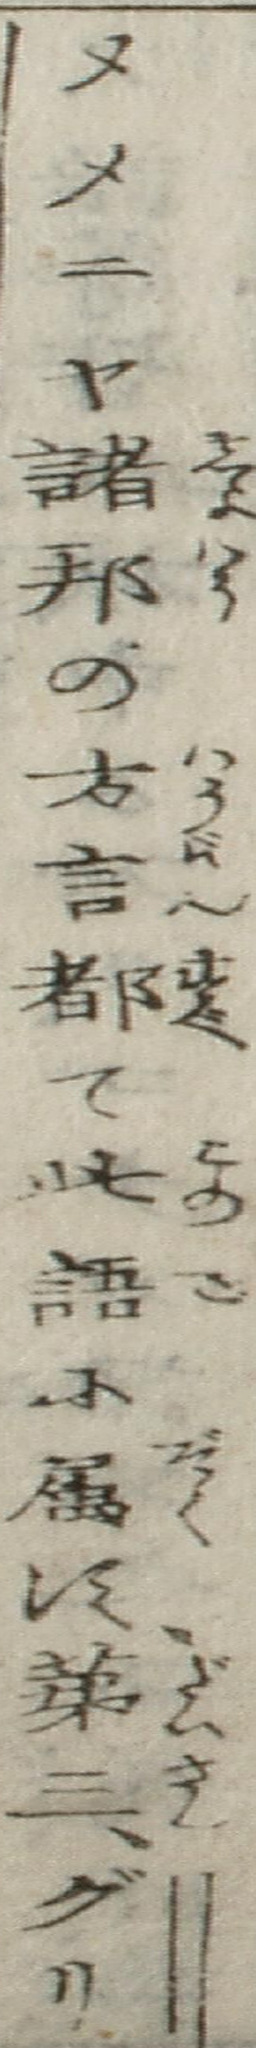メメニヤ諸邦の方言都て此語に属す、第三、グリ
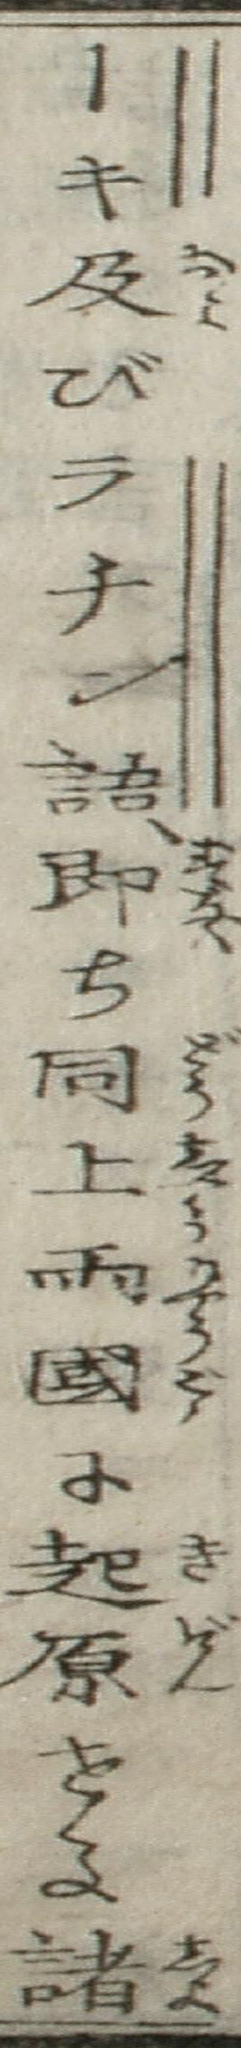ーキ及びラチン語、即ち同上両国に起原せる諸
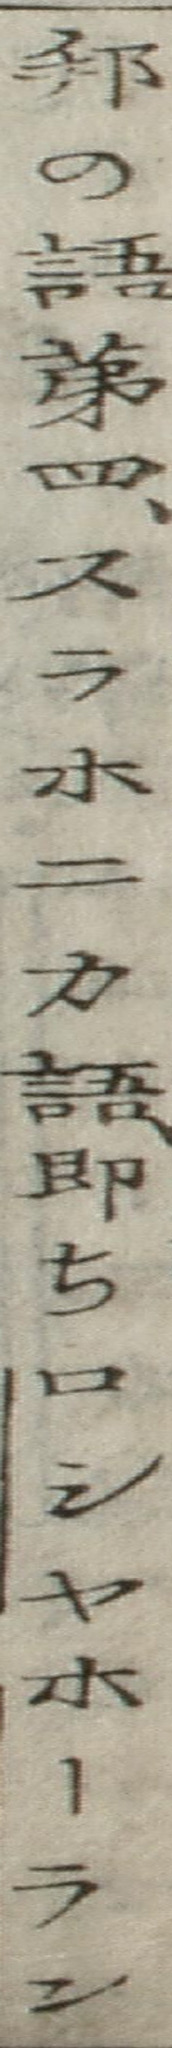邦の語、第四、スラホニカ語、ロシヤホーラン
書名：訓蒙　天然地理學　下
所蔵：東京大学地震研究所図書室 Earthquake Research Institute Library, The University of Tokyo, JAPAN
